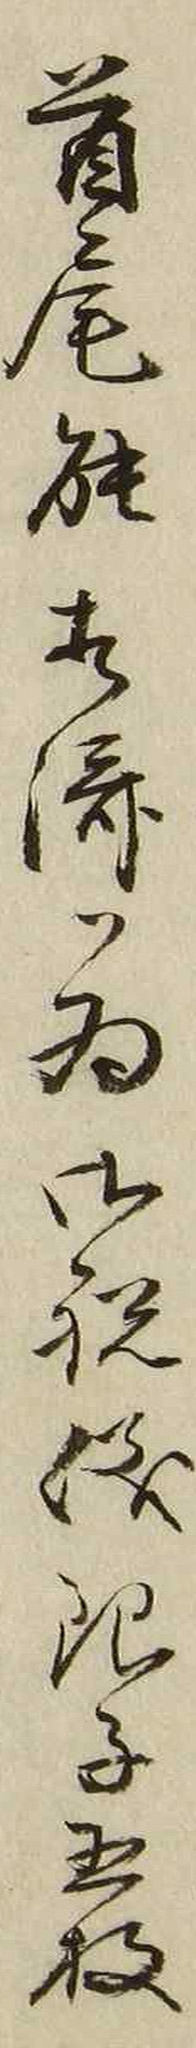首尾能相済候為御祝儀銀子五枚
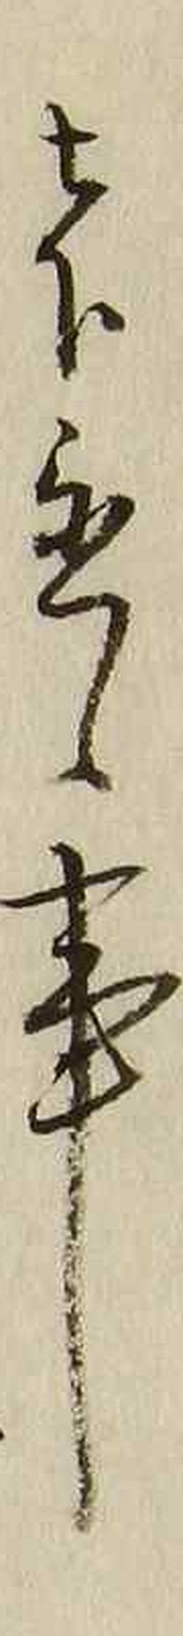被下置候事
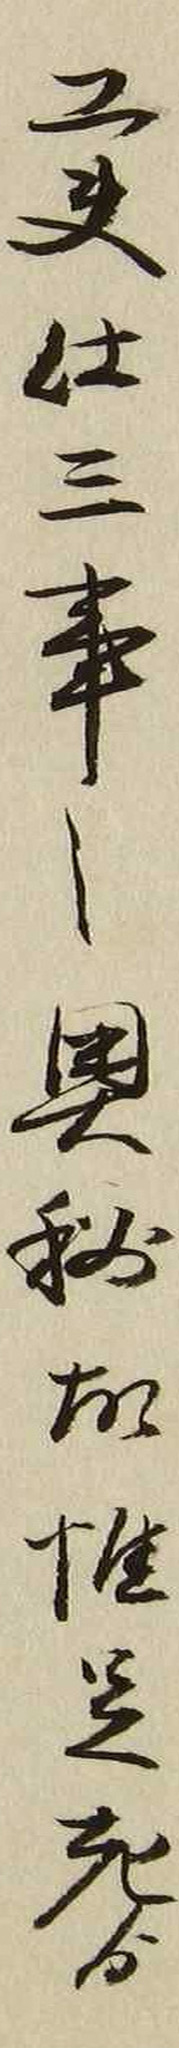工夫仕三事之奥秘故惟足老ゟ
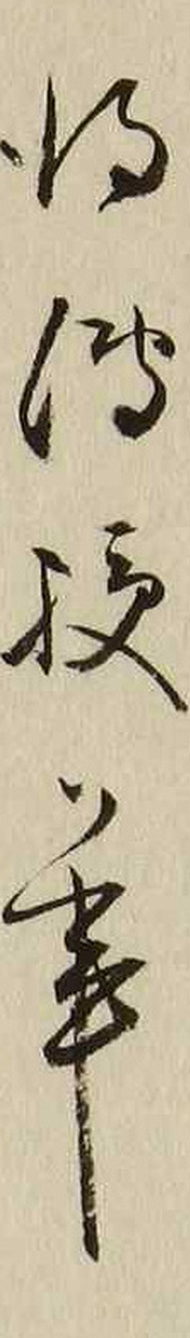得伝授候事
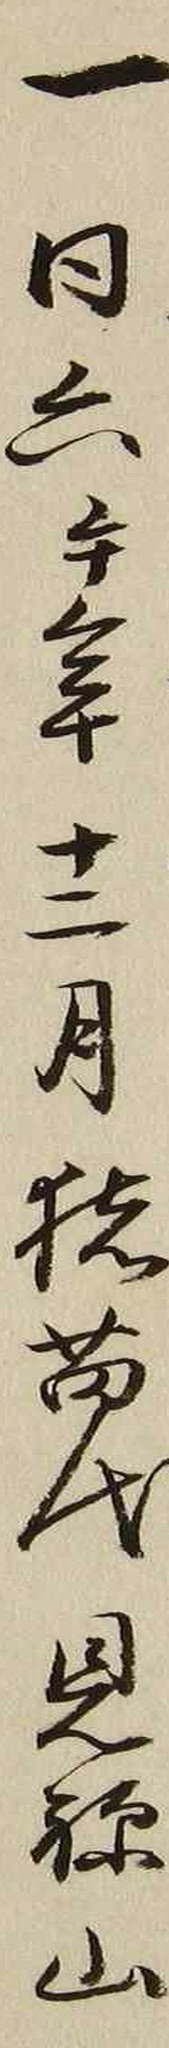一同六午年十二月猪苗代見祢山
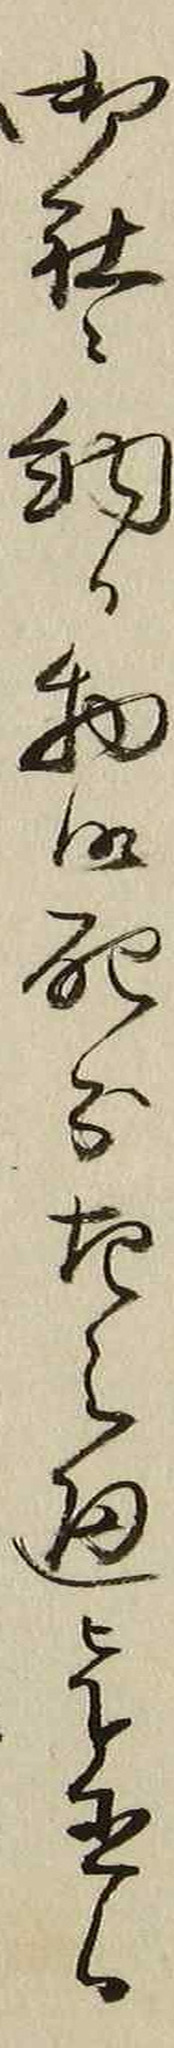御社ニ納候物御配分左之通被下置候
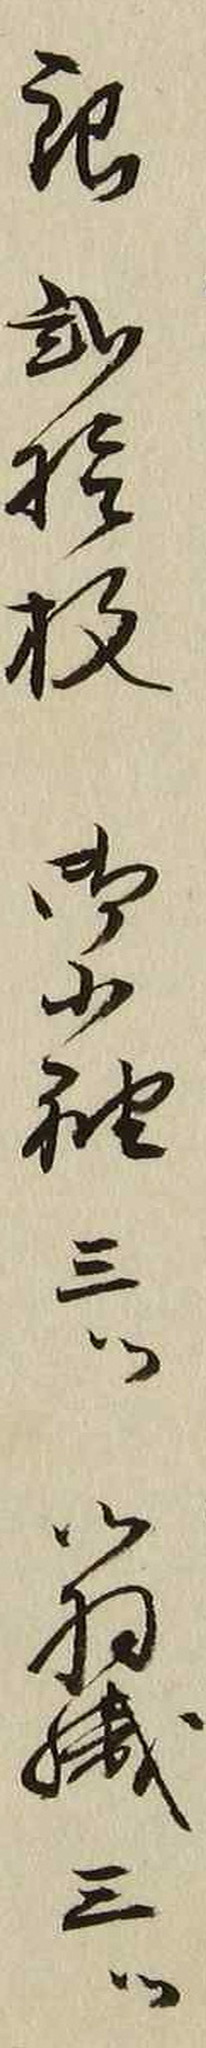銀弐拾枚御小袖三ツ御羽織三ツ
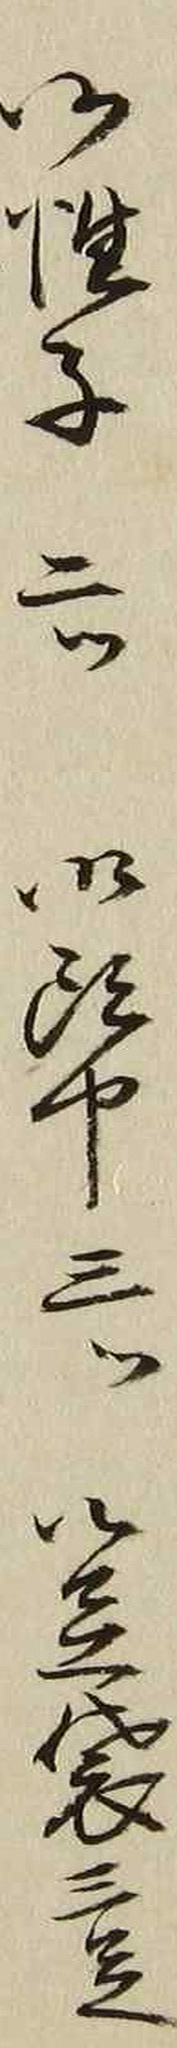御帷子二ツ御頭巾三ツ御足袋三足
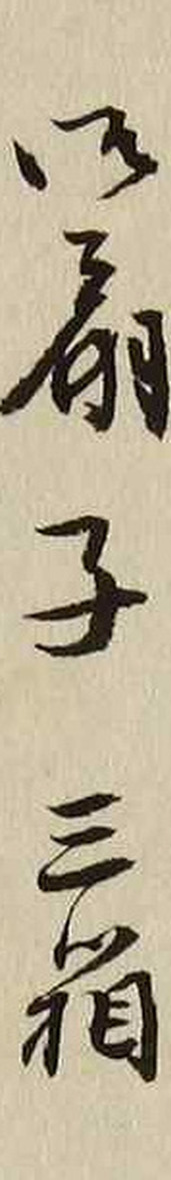御扇子三箱
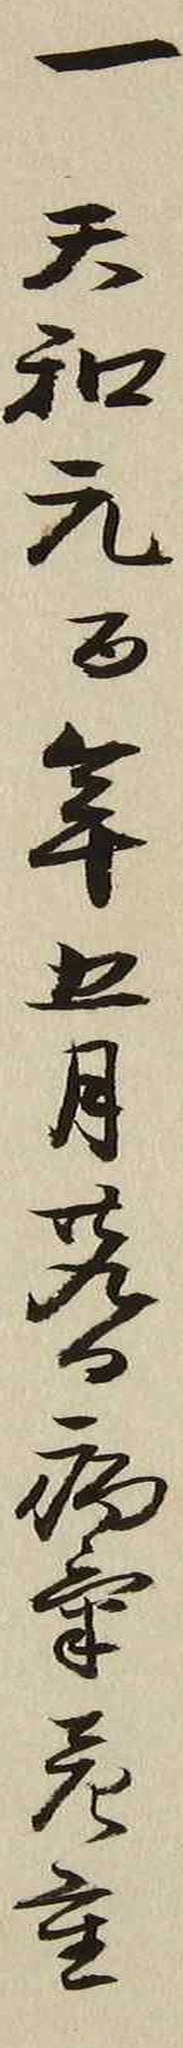一天和元酉年五月廿九日病気差重
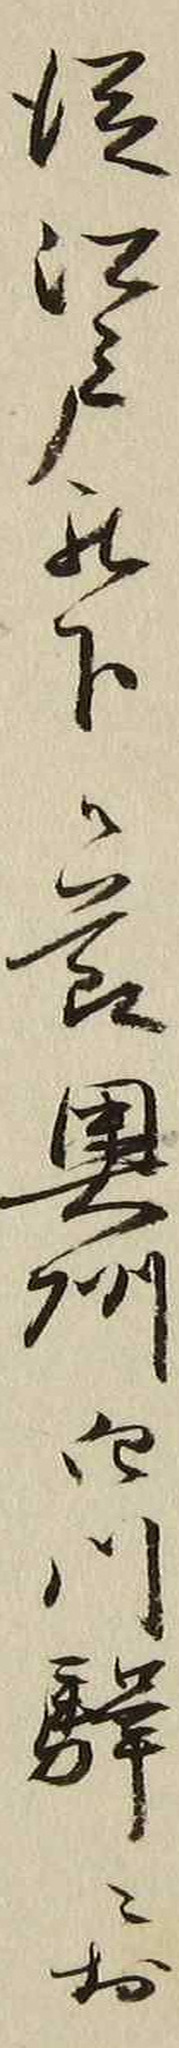従江戸罷下候節奥州白川駅ニ於
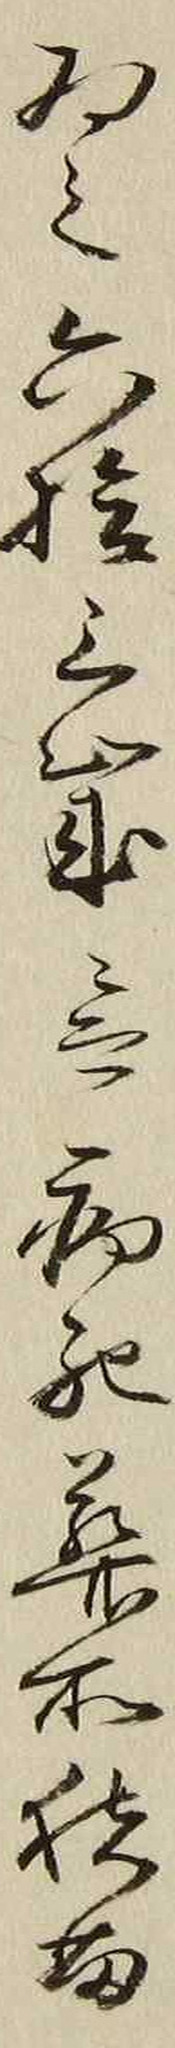ゐて六拾三歳ニ而病死葬所猪苗
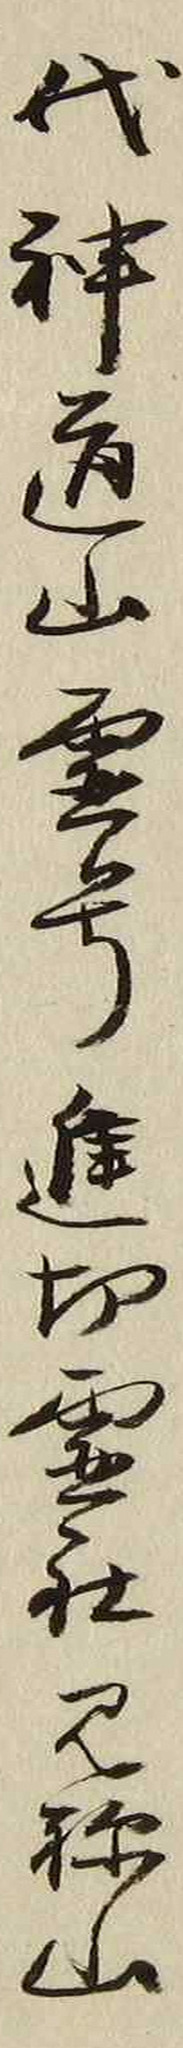代神道山霊号進切霊社見祢山
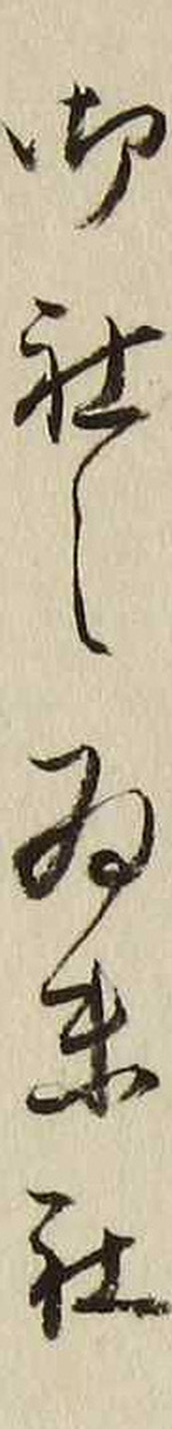御社之為未社
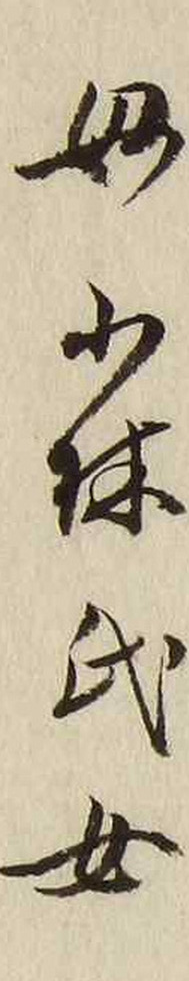母小林氏女

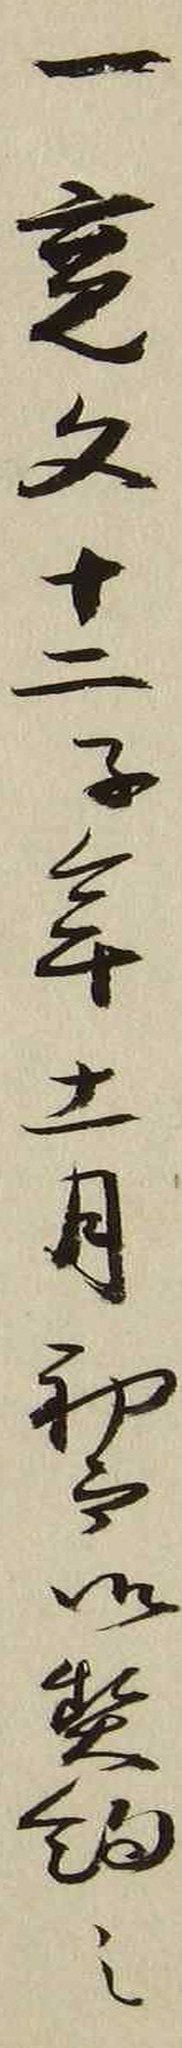一寛文十二子年十一月初而御契約之
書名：諸士系譜　巻之291　さ之部23
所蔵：会津若松市立会津図書館
